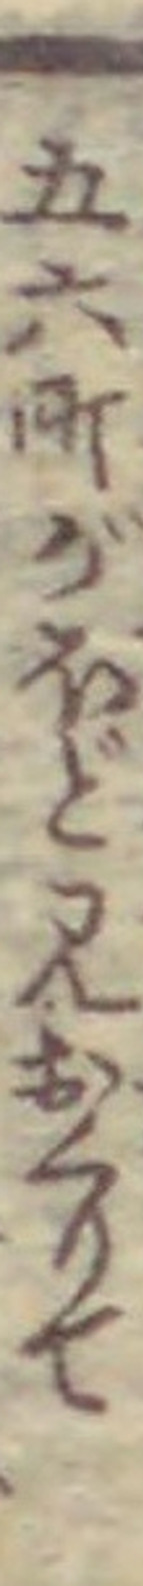五六町がほど見おくりて
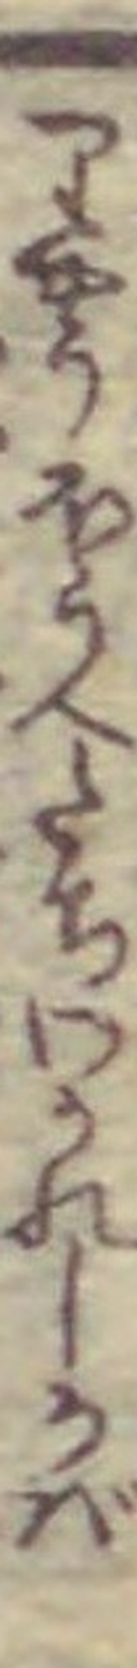りやうほうへたちわかれしかば
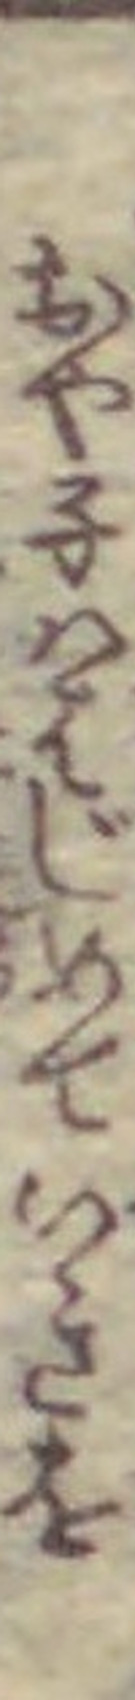おや子ははじめていきを
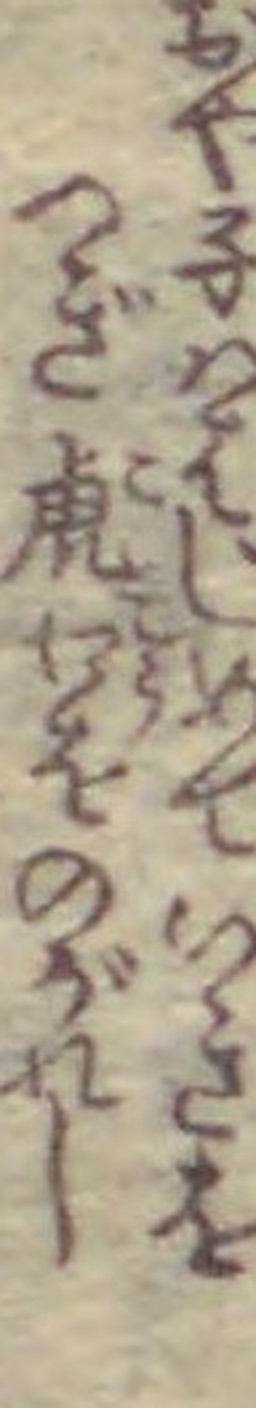つぎ虎口をのがれし
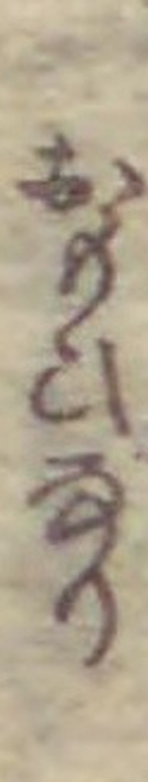おもひなり

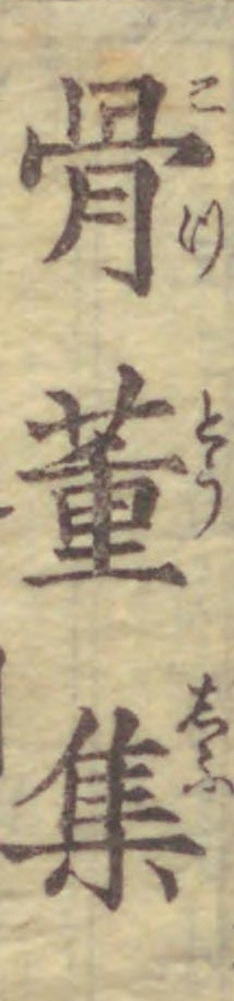骨董集
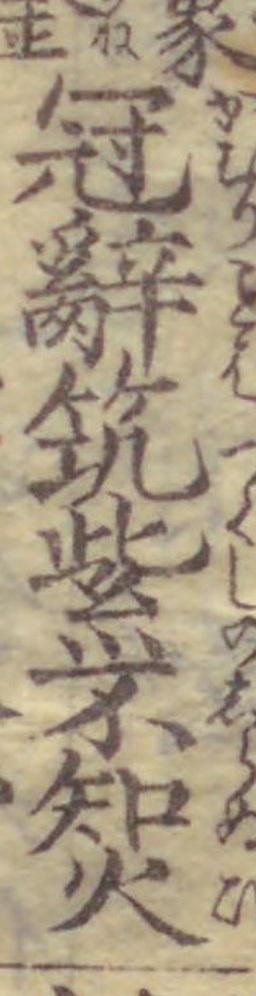冠辞筑紫不知火
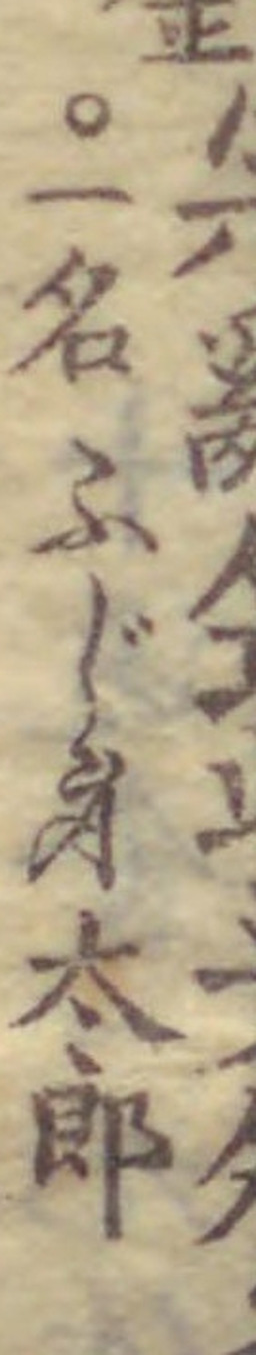一名ふじ身太郎
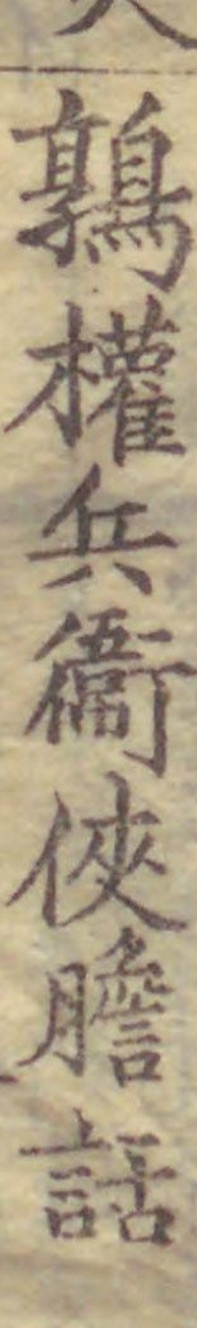鶉権兵衛俠膽話
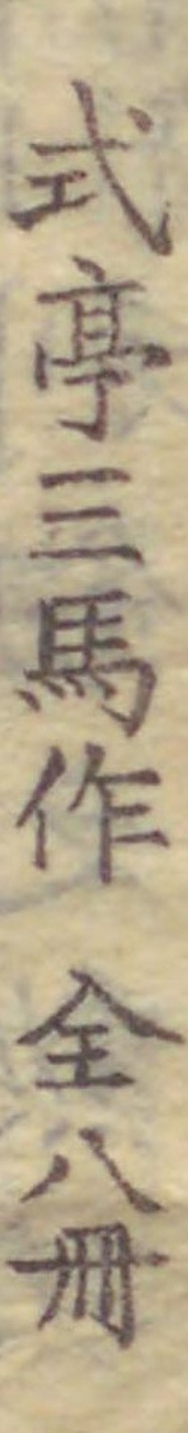式亭三馬作全八冊
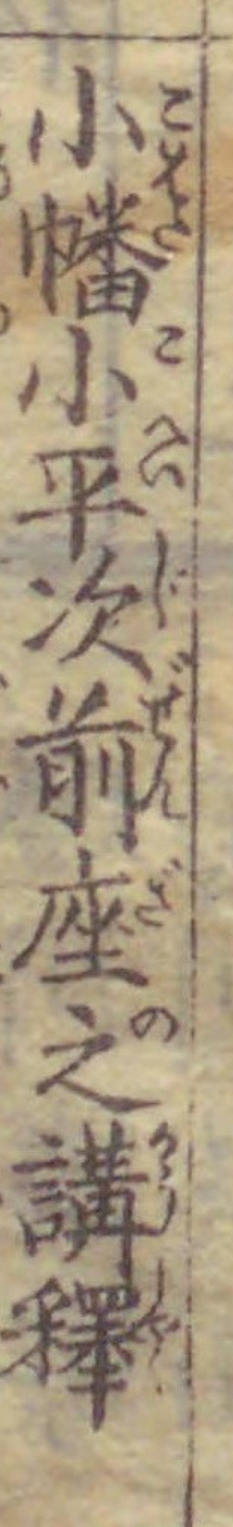小幡小平次前座之講釈
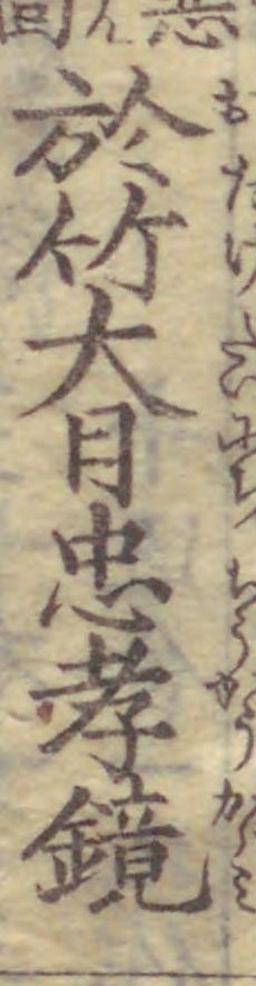於竹大日忠孝鏡
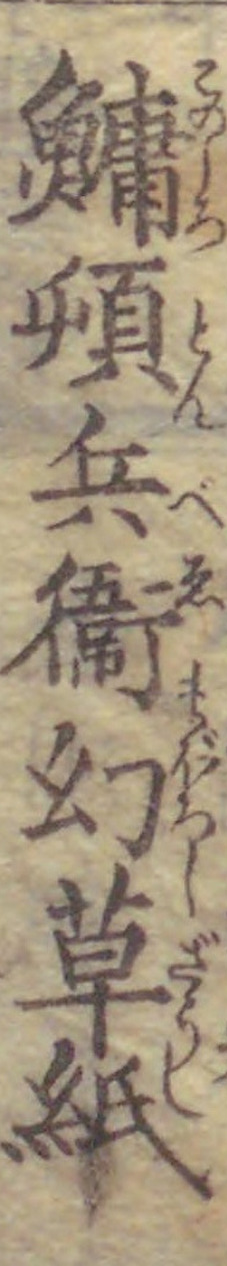鱇頓兵衛幻草紙
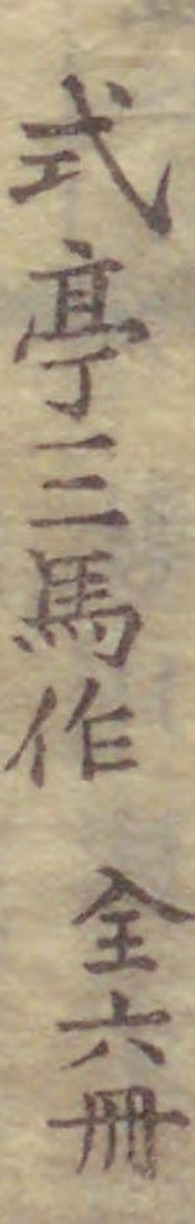式亭三馬作全八冊

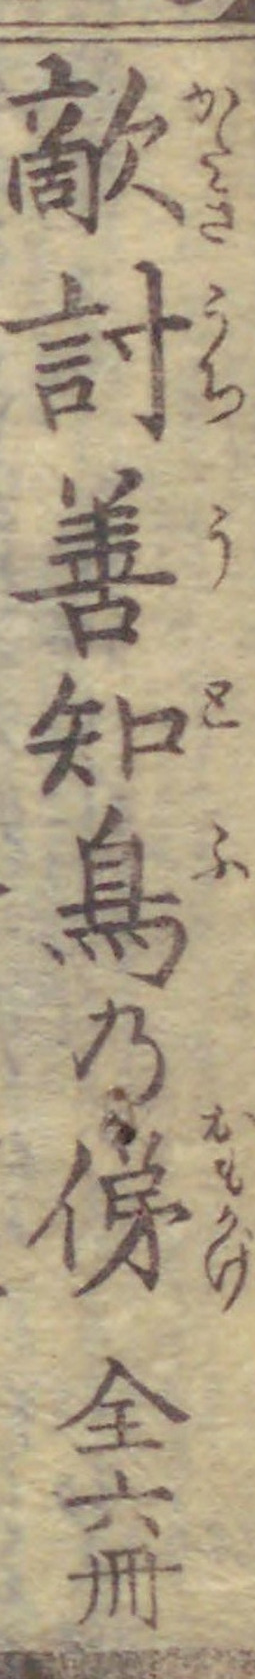敵討善知鳥乃俤全六冊
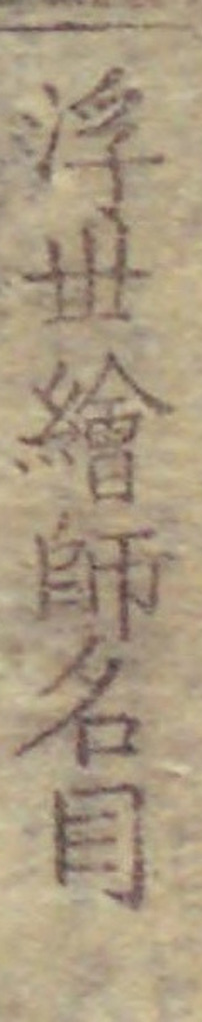浮世絵師名目
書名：八ツ目鱣因縁物語 3巻
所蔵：国立国会図書館 National Diet Library, JAPAN
